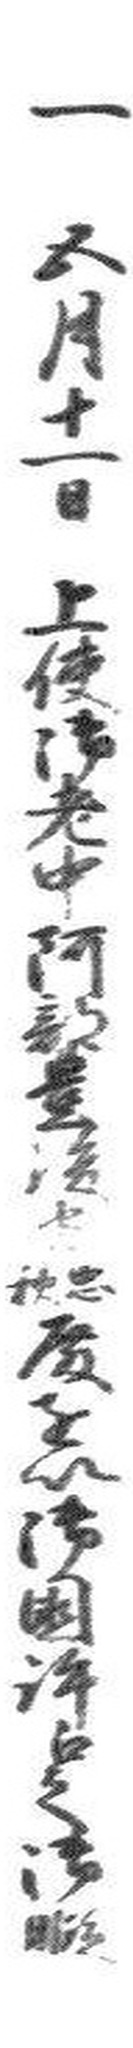一五月十一日上使御老中阿部豊後守忠秋殿を以御国許江之御暇
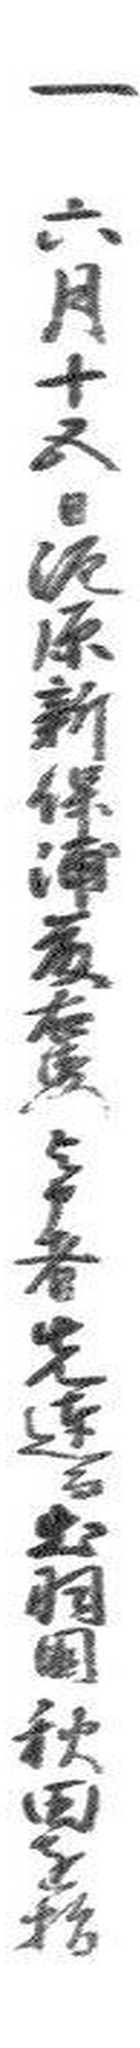一六月十五日泥原新保浦藤右衛門と申者先達而出羽国秋田を指
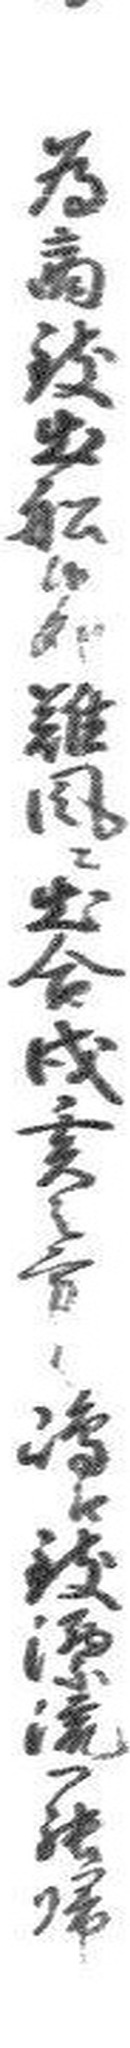為商致出船候処難風ニ出合戌亥之方之嶋江致漂流罷帰
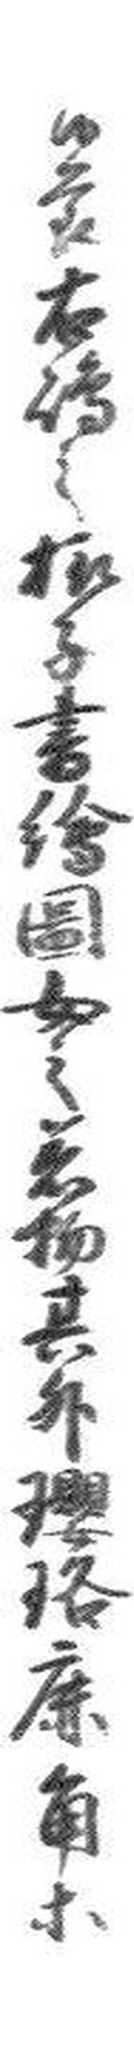候節右嶋之様子書絵図女之着物其外瓔珞鹿角等

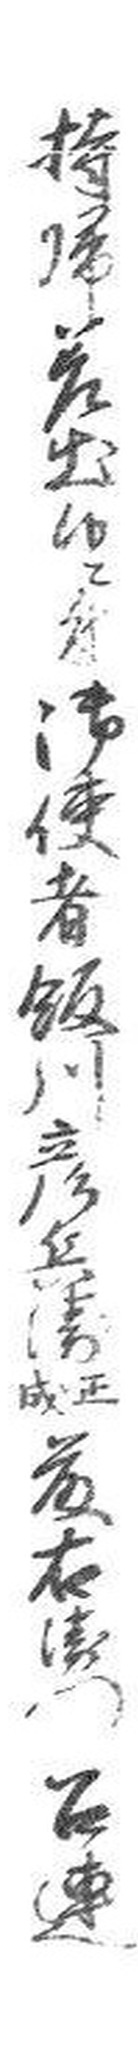持帰差出候ニ付御使者飯川彦兵衛正成藤右衛門召連
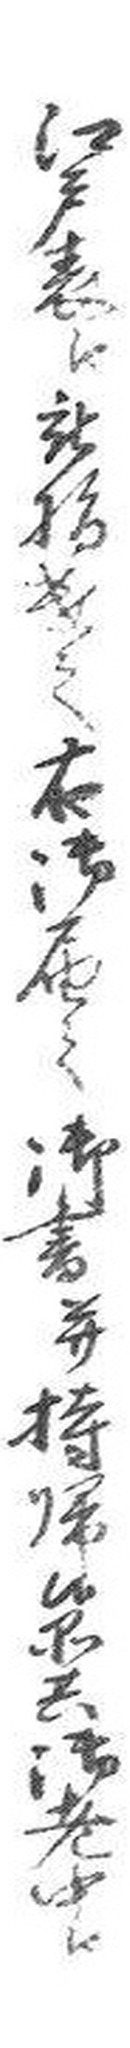江戸表江被指遣之右御届之御書并持帰候品共御老中江
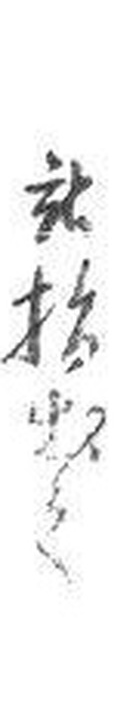被指出之
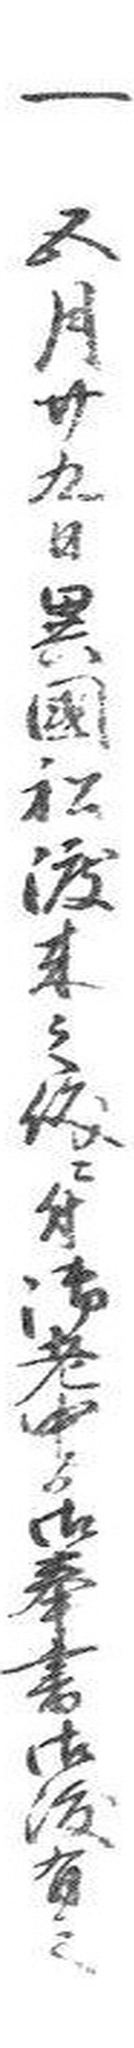一五月廿九日異国船渡来之儀ニ付御老中ゟ御奉書御渡有之
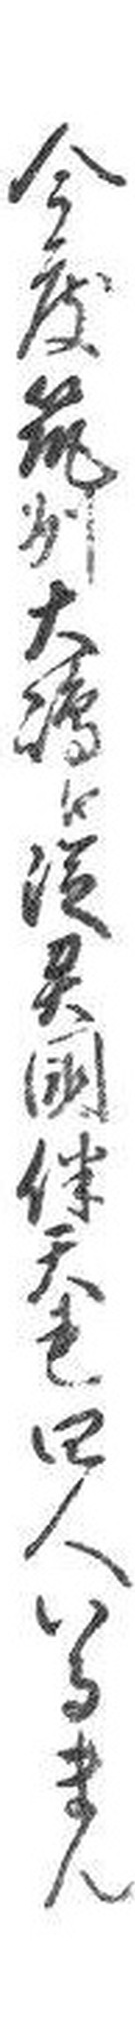今度筑州大嶋江従異国伴天連四人いるまん
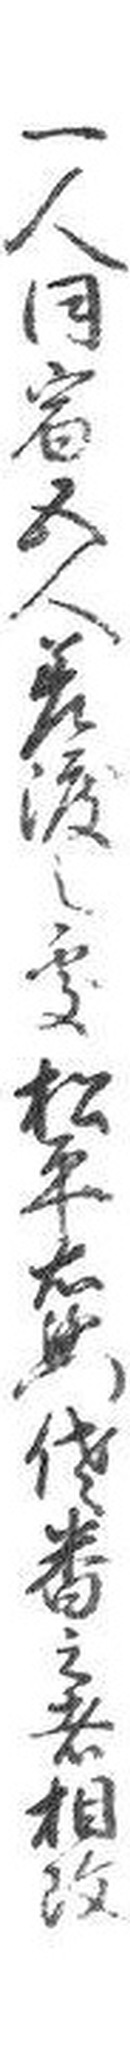一人同宿五人差渡之処松平右衛門佐番之者相改
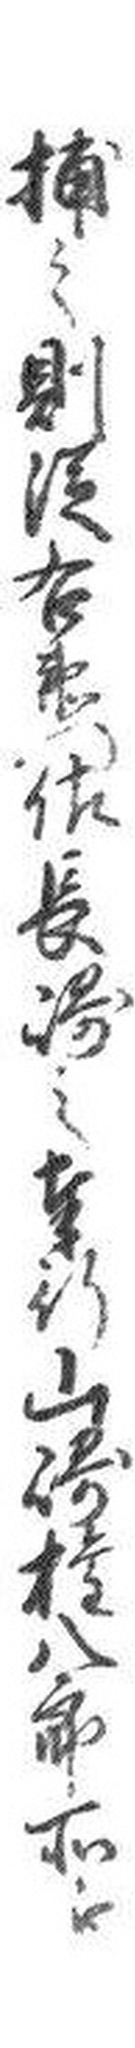捕之則従右衛門佐長崎之奉行山崎権八郎所江
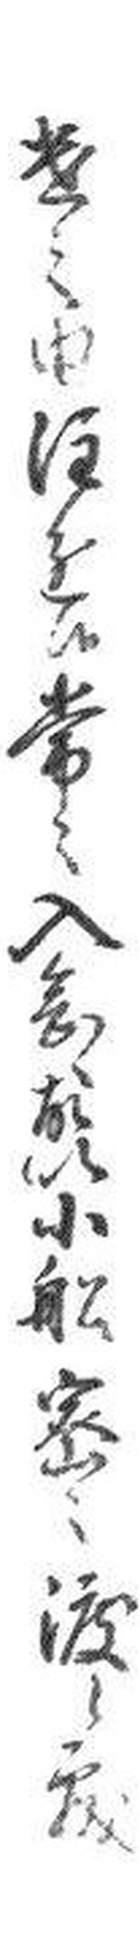遣之由注進候常々入念候故以小船密々渡候処
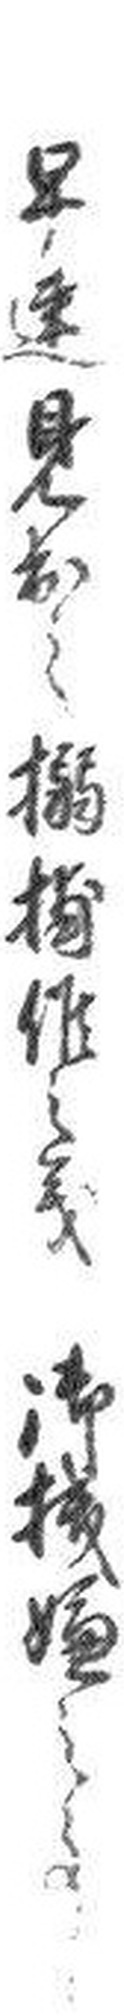早速見出之搦捕候之義御機嫌之事
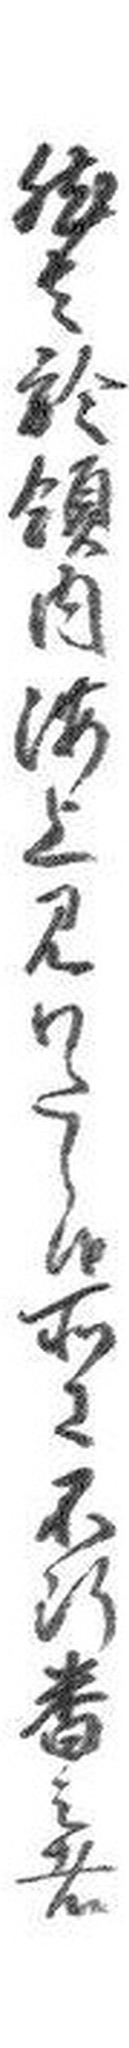然者於領内海上見わたし候所に不断番之者
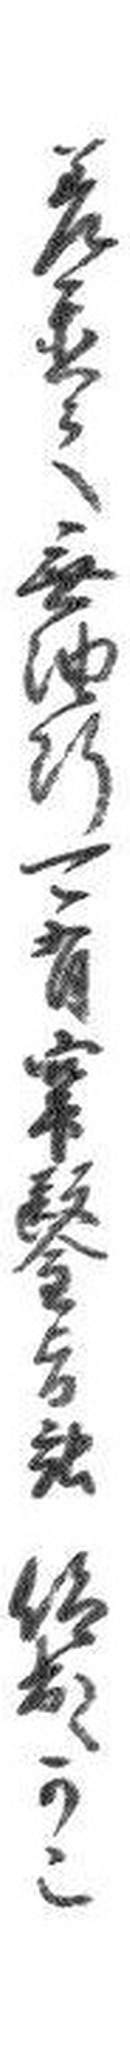差置之無油断可有穿鑿旨被仰出候可被
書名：家譜 四 忠昌公 従寛永七年到正保四年
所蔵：福井県文書館 Fukui Prefectural Archives
